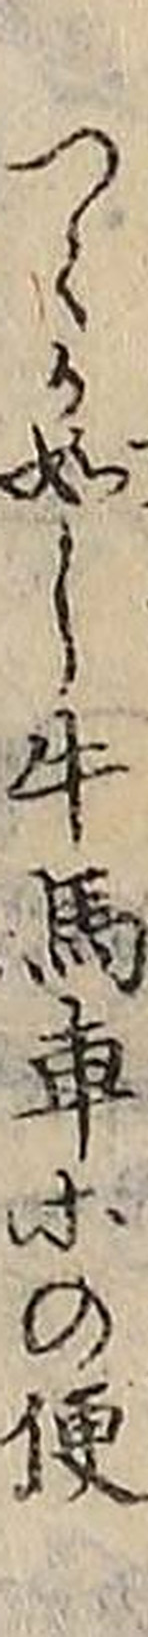つくか如し牛馬車等の便
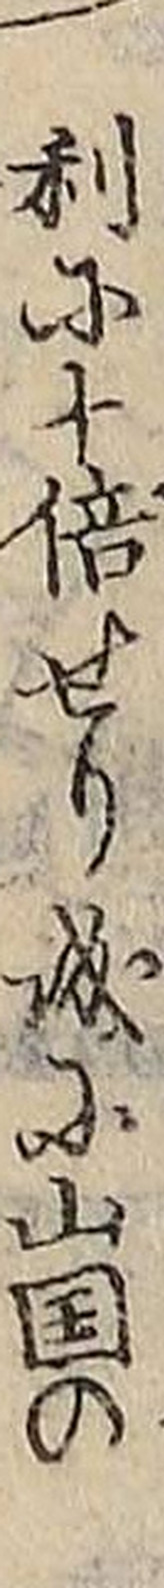利に十倍せり誠に山国の
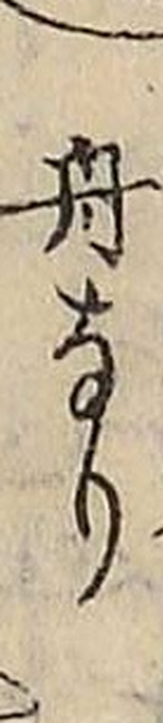舟なり
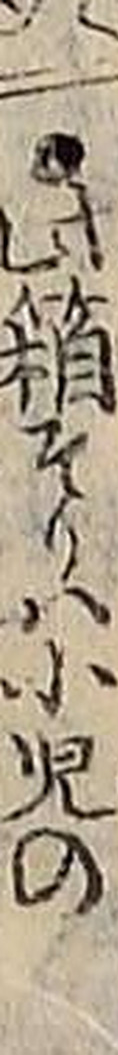此箱そりは小児の
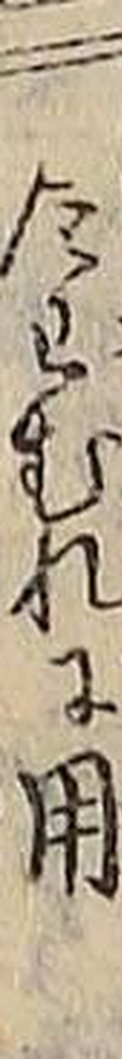たわむれに用
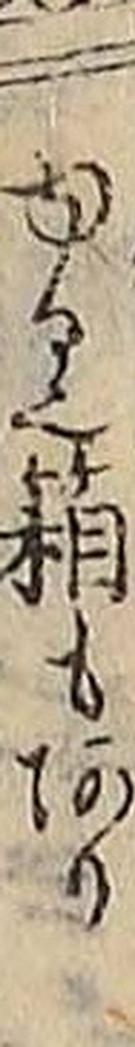ゆる也箱もあり
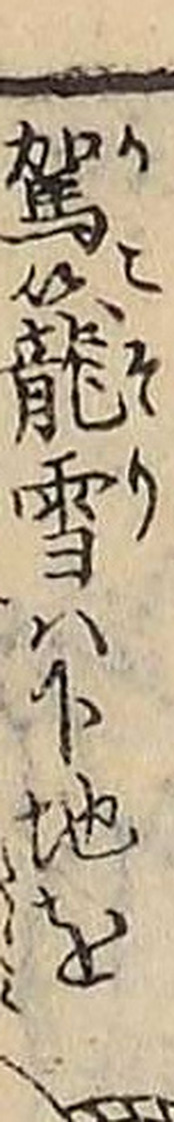駕籠雪は下地を
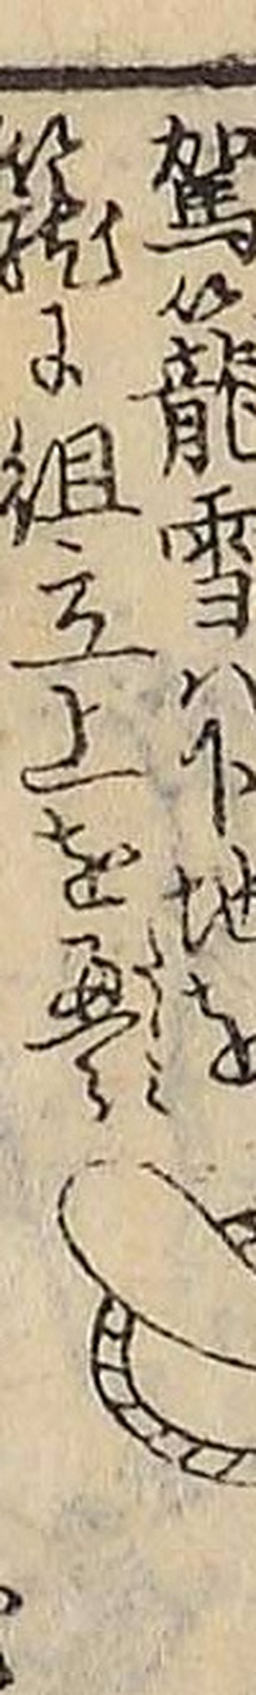籠に組立上を畳
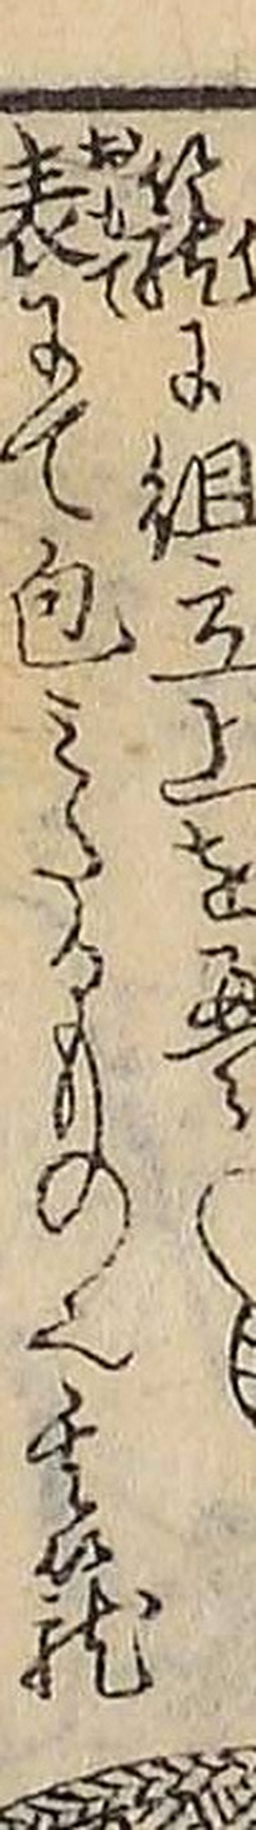表にて包みたるもの也其籠
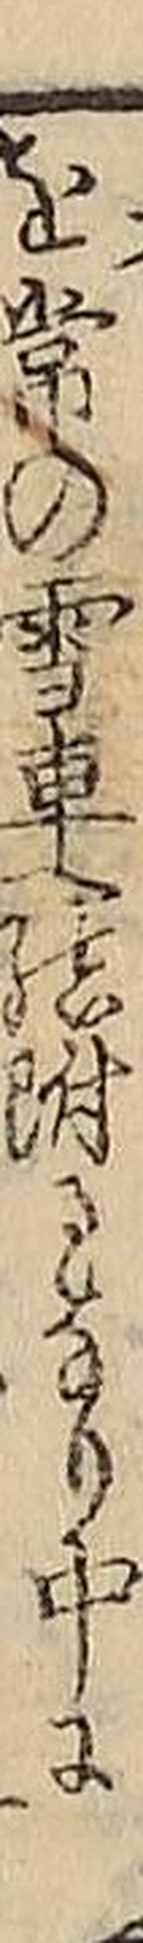を常の雪車へ結附るなり中に
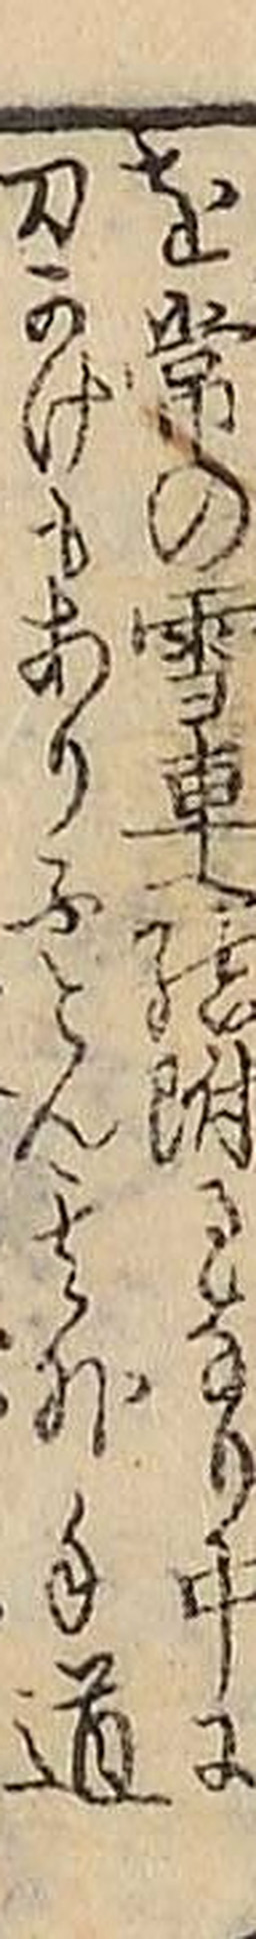刀かけもありふとん其外手道
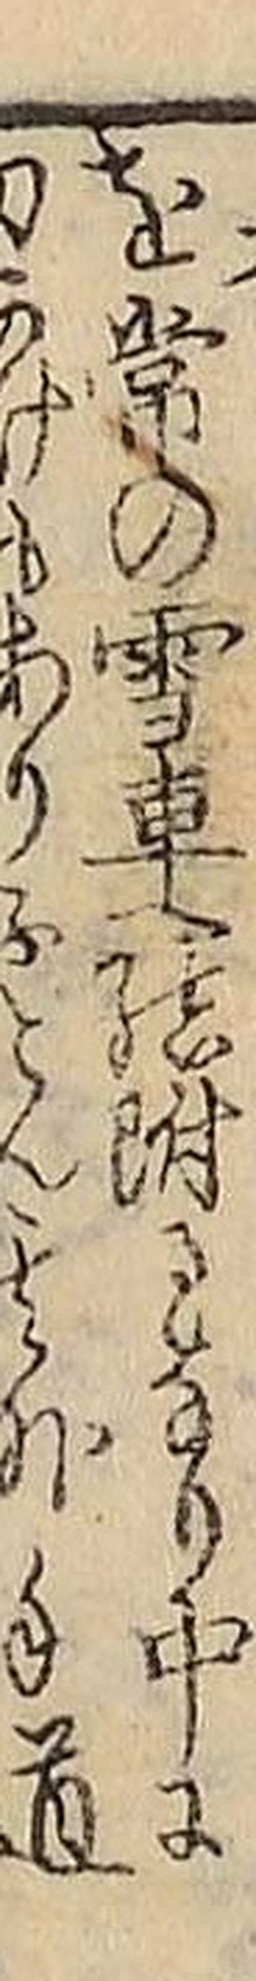刀かけもありふとん其外手道
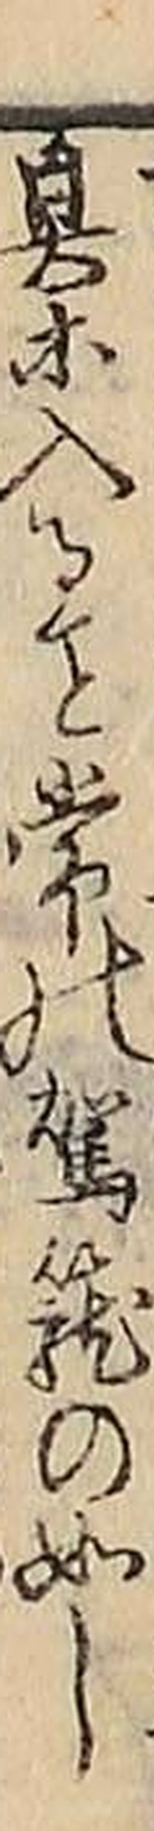具等入ること常の駕籠の如し
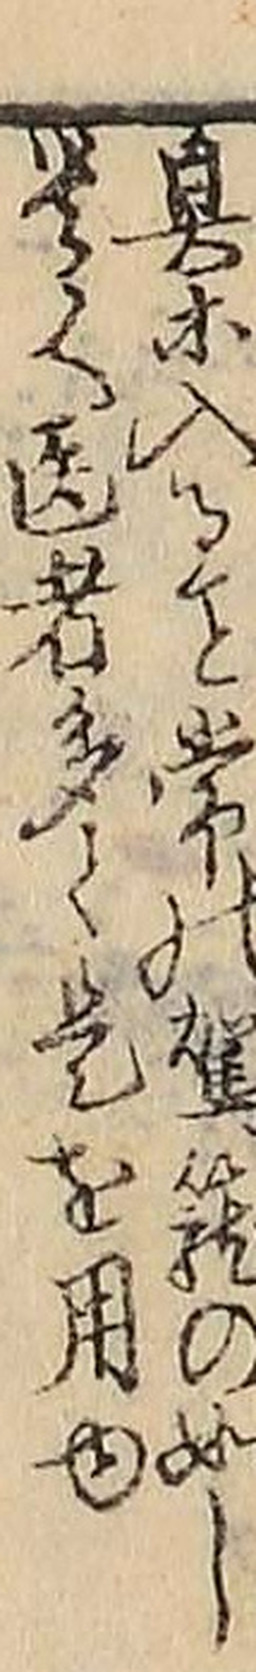貴人医者多く是を用ゆ
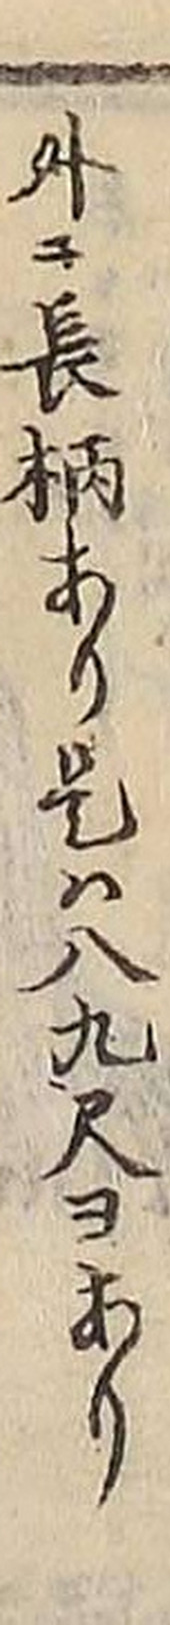外長柄あり是は八九尺ヨあり
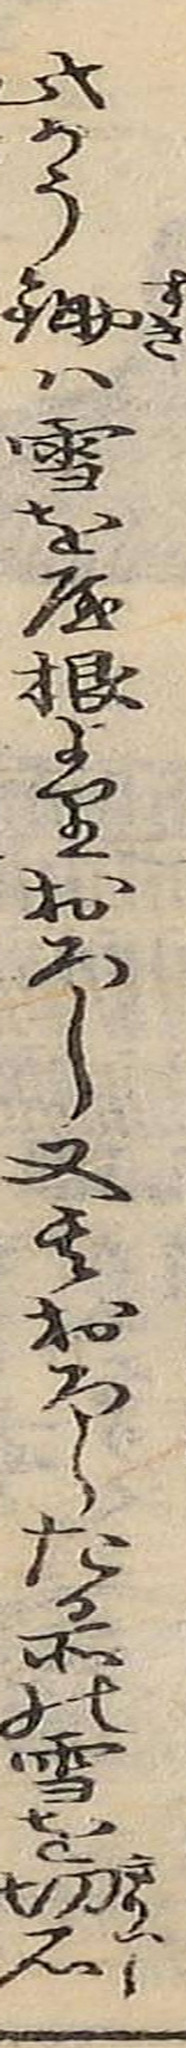此かう鋤は雪を屋根よりおろし又其ろしたる所の雪を切石
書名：旅行用心集
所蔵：神戸大学附属図書館 国文学研究資料館
